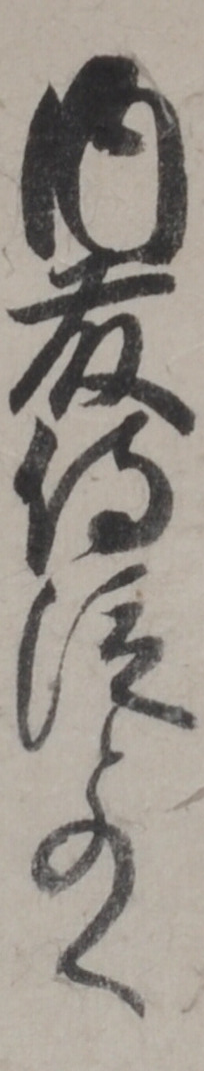内藤侍従とのへ

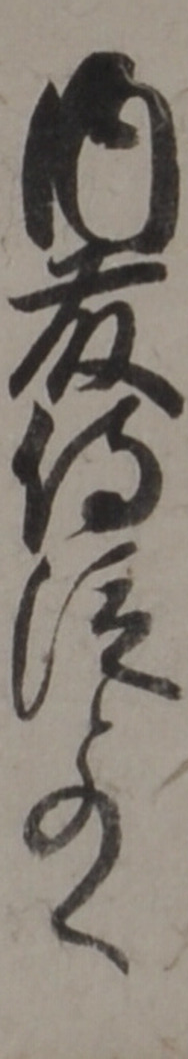内藤侍従とのへ

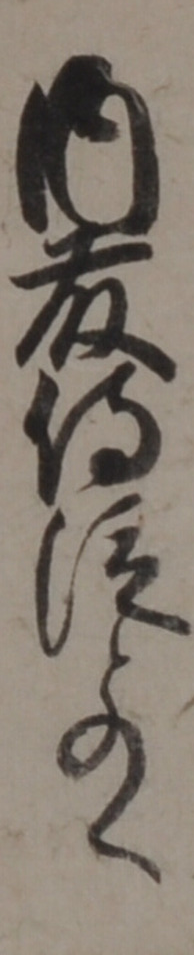内藤侍従とのへ
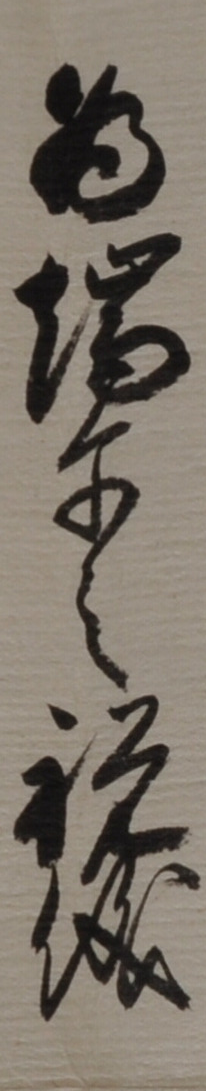為端午之祝儀
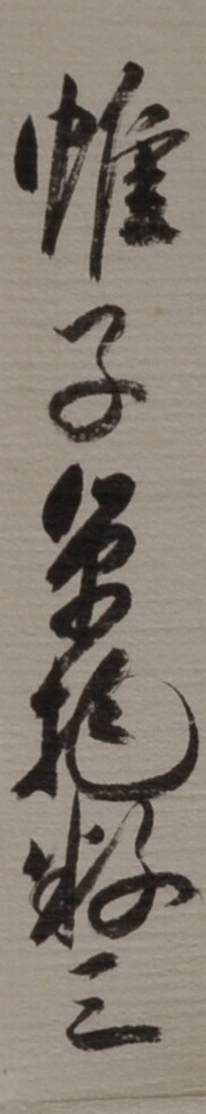帷子単物数三
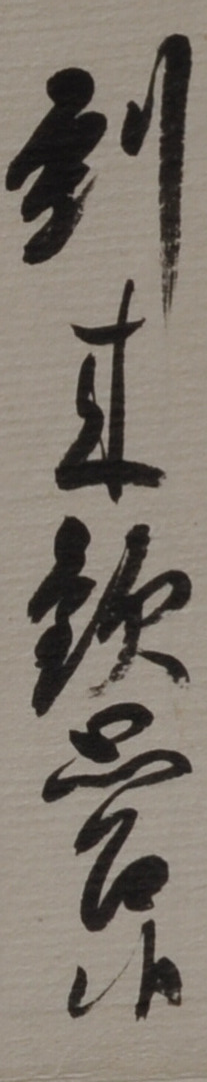到来歓思召候
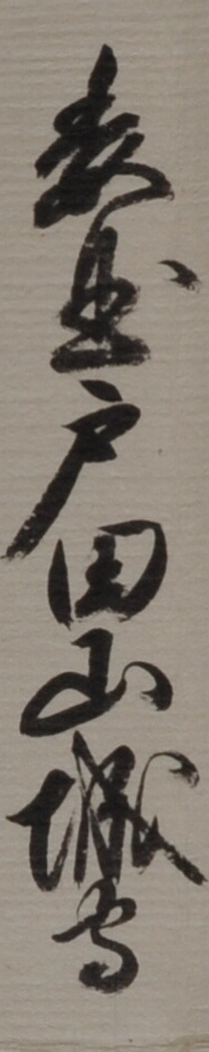委曲戸田山城守
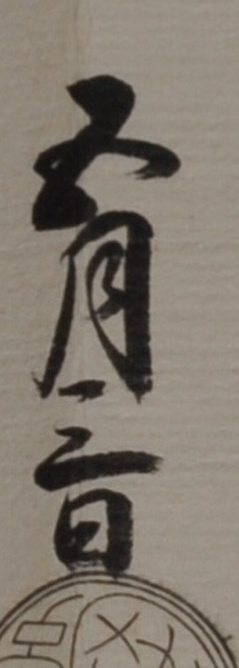五月三日
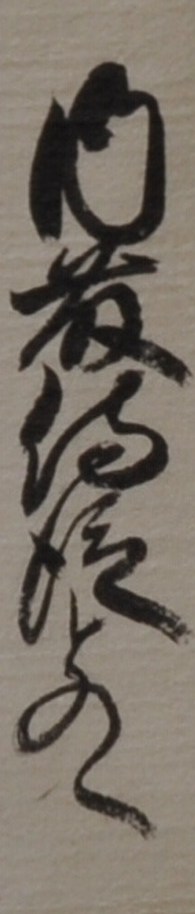内藤侍従とのへ
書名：御内書
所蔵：伊那市立高遠町図書館・合同会社AMANE
